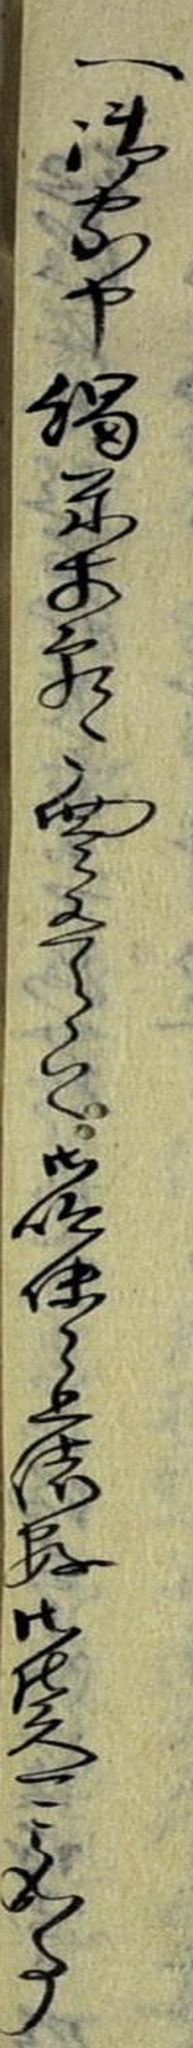一御家中餲米相願候面々有之候はゝ御吟味之上俵数御貸可被成事
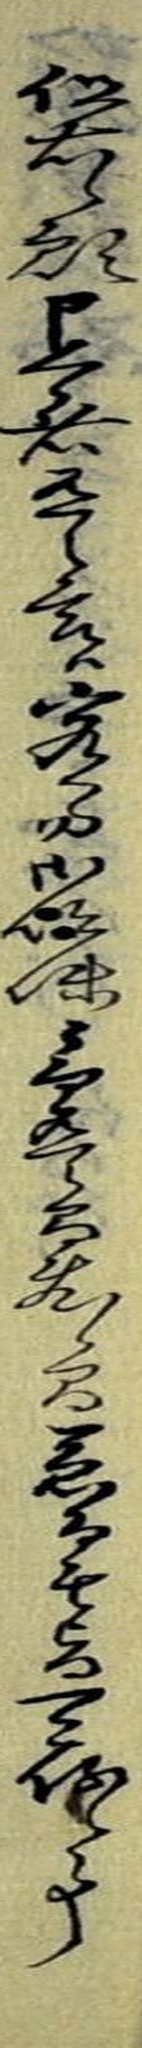但右之願申上候者有之節は容易御吟味に而有之間敷候間兼其旨可存候事
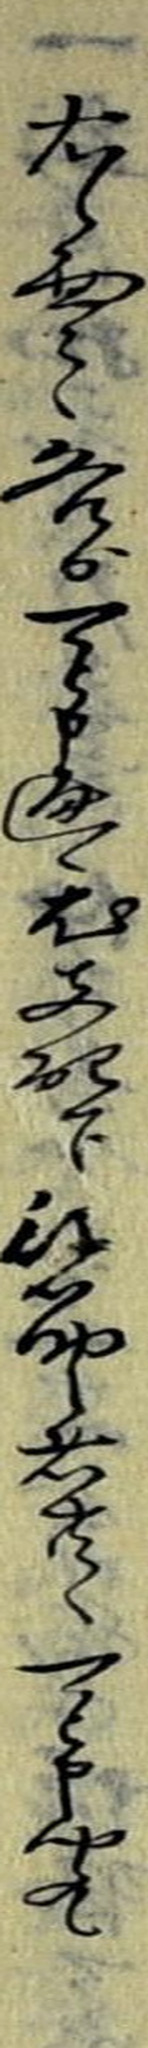右之面々へ各ゟ可被申通候尤支配下役筋之者共へ可被申聞候
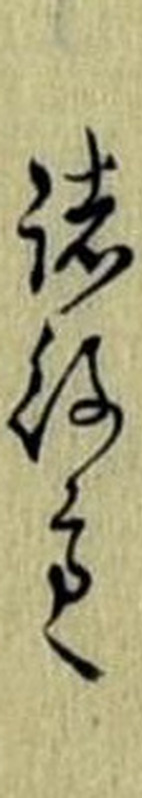諸役方へ
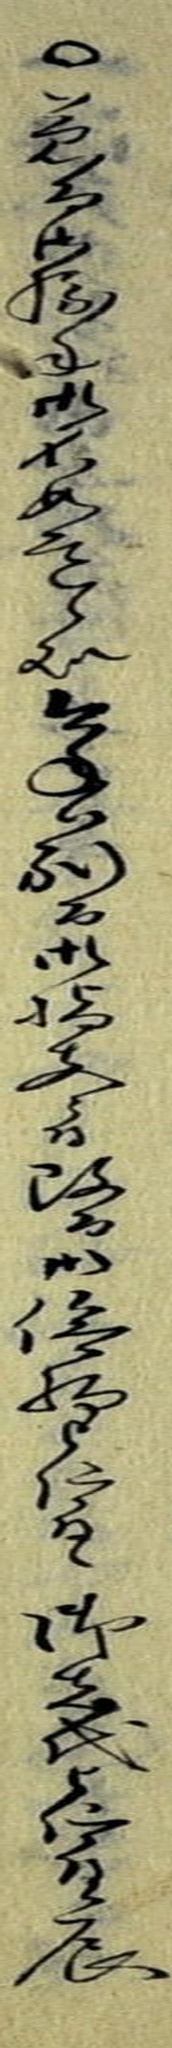〇兼而御勝手御不如意之処今年別而御指支に付改而御倹約被仰付候御先代被仰付候辰
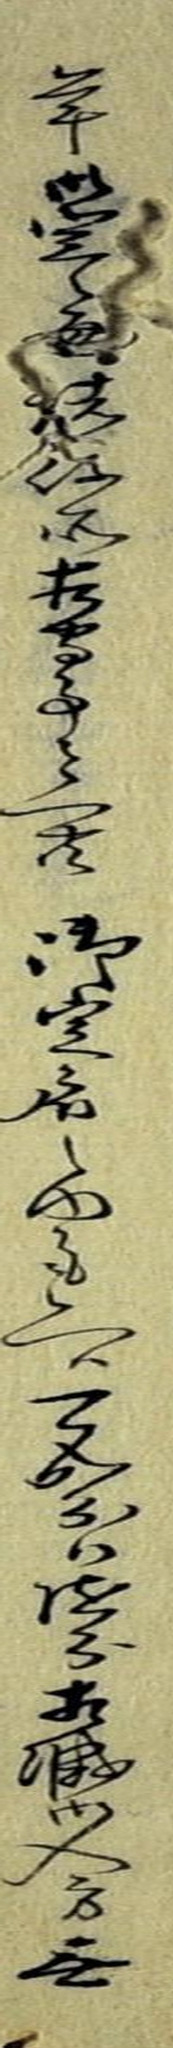年御定之通諸役所相守事に候へ共御定府之内にも候へは可成分は随分相減御入方無
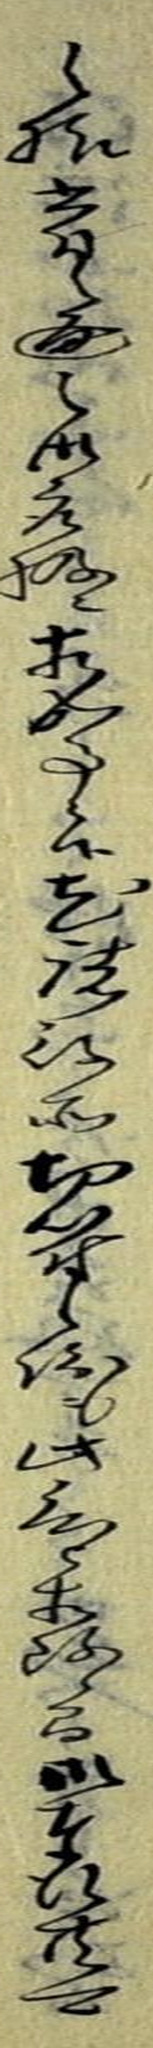之様書付之通之御取扱に相成事に候尤諸役所切符之儀も此度被相改候間御奉行共可
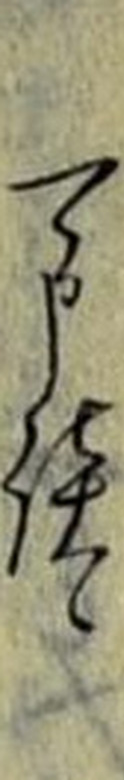可申談候
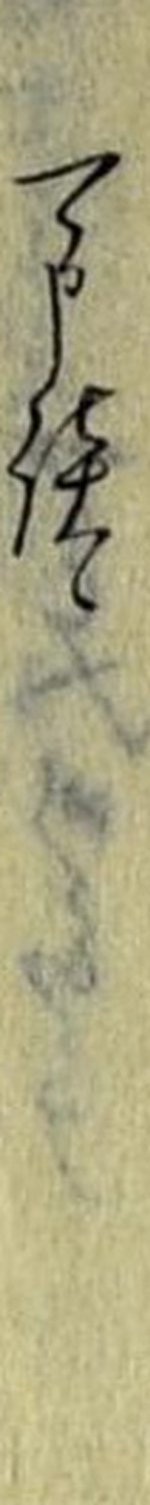可申談候
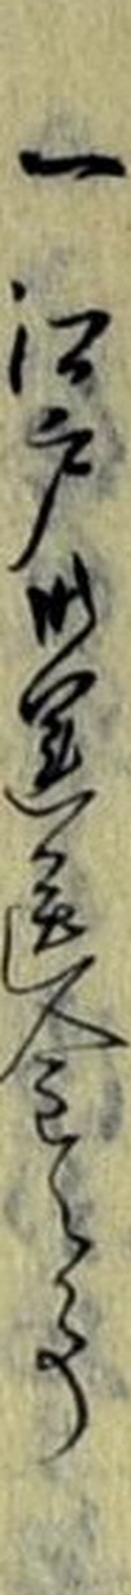一江戸御運送金之事
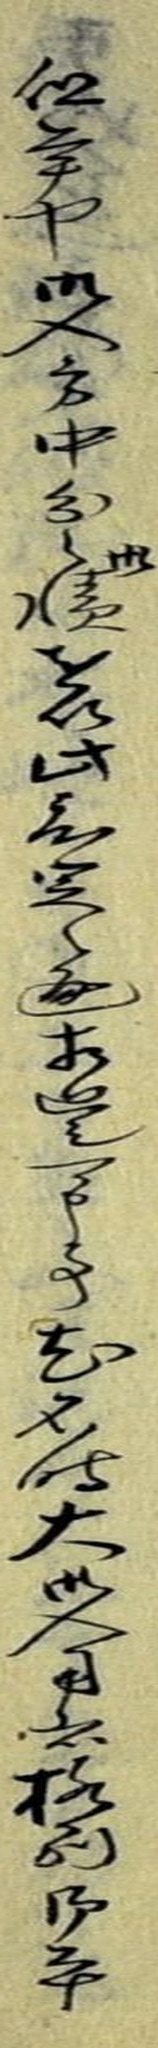但年中御入方中分之御積を以此度定之通相廻し可申事尤不時大御入用は格別御平
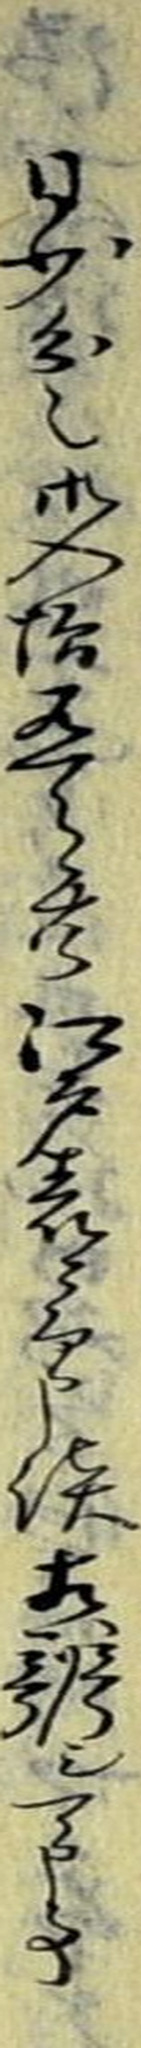日少分之御入増有之候共江戸表に而申談相弁し可申事
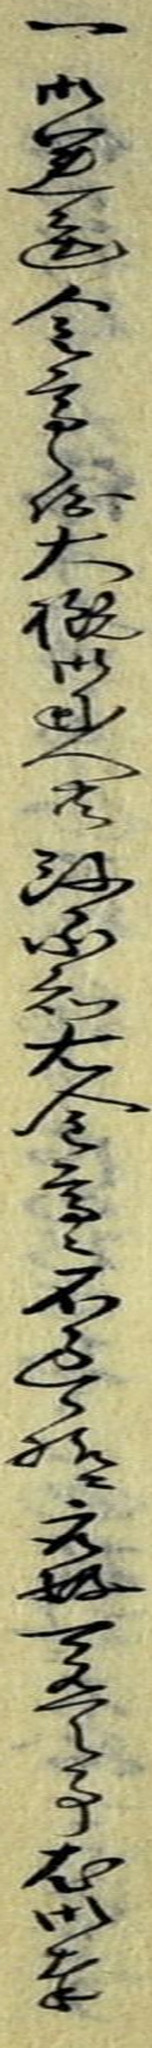一御運送金高之儀大概御用人共致承知右金高に不過候様に取扱可有之事尤御奉
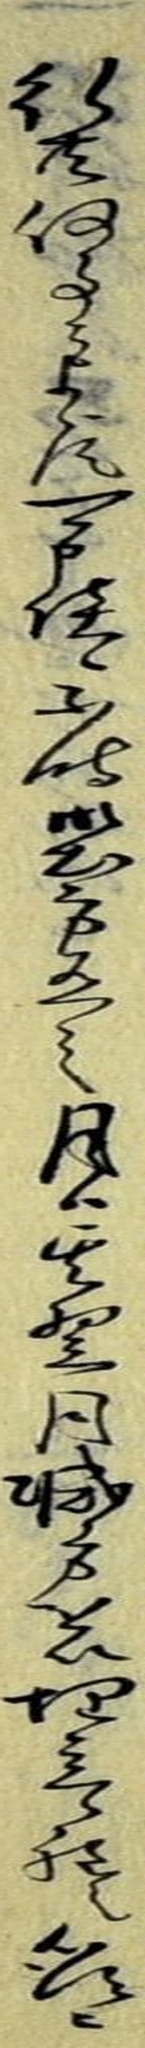行共何事によらす可申談候不時御出方有之月は其翌月減方を以埋立候程之心得に
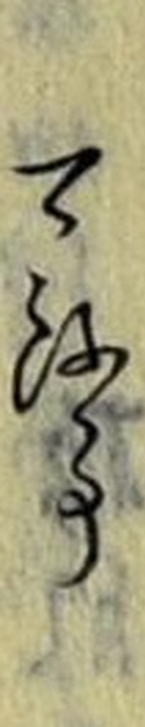可致事
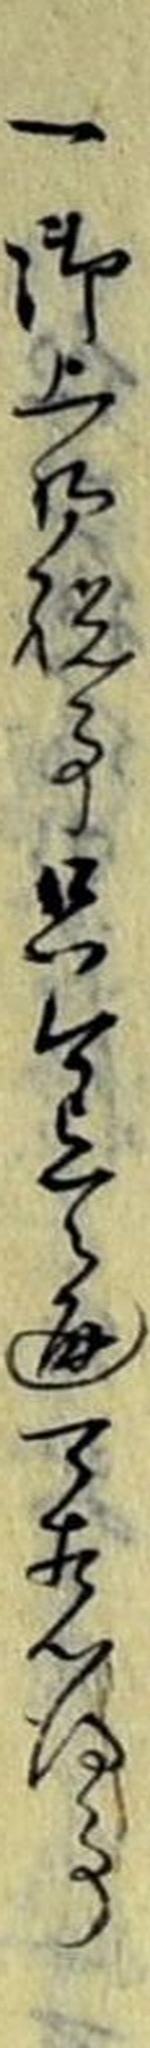一御上御祝事只今迄之通可相心得事
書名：命令之部 二
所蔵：福井県文書館 Fukui Prefectural Archives
